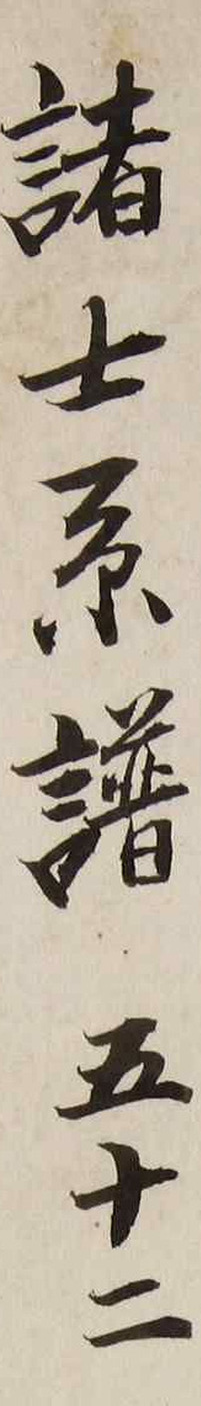諸士系譜五十二

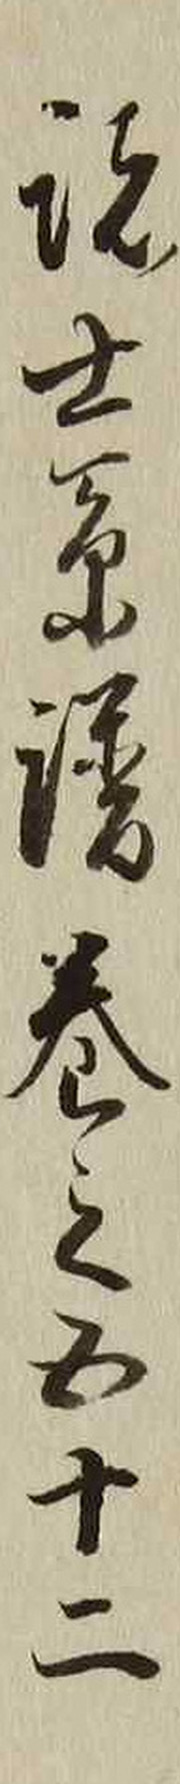諸士系譜巻之五十二
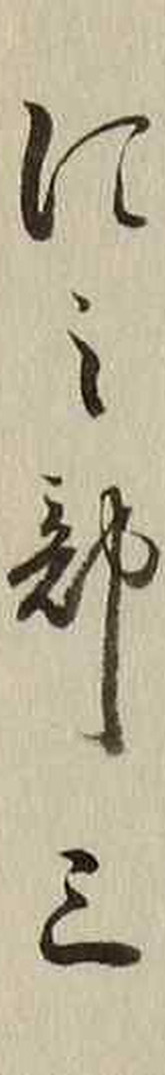に之部三
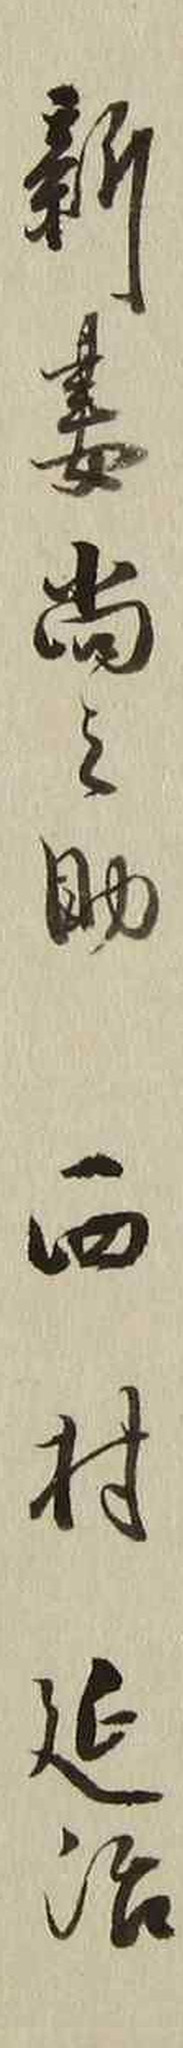新妻尚之助西村延治
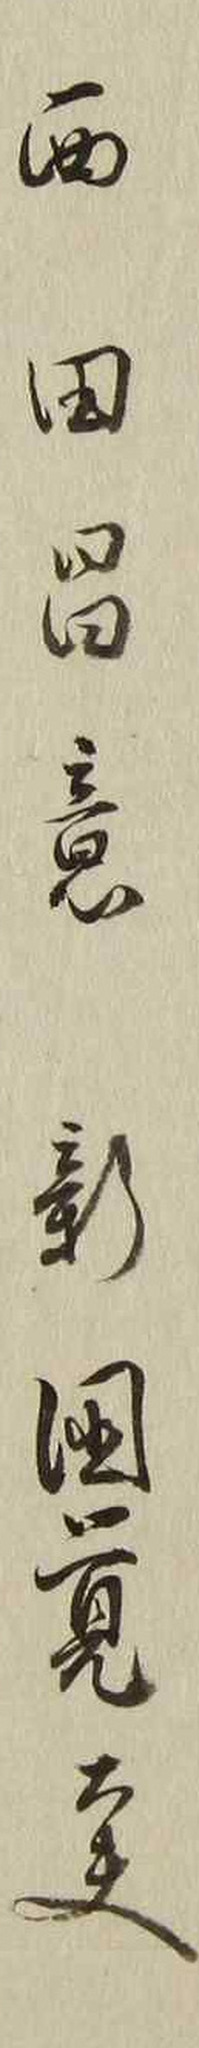西田昌意新田覚大夫

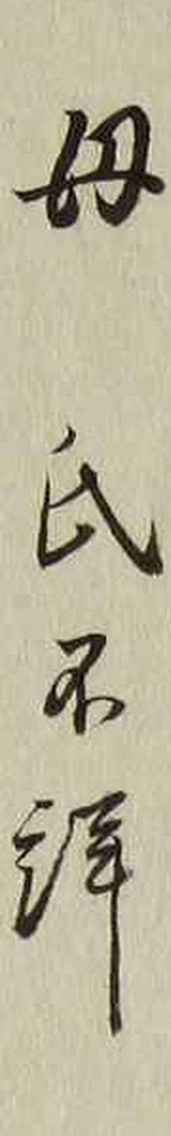母氏不詳
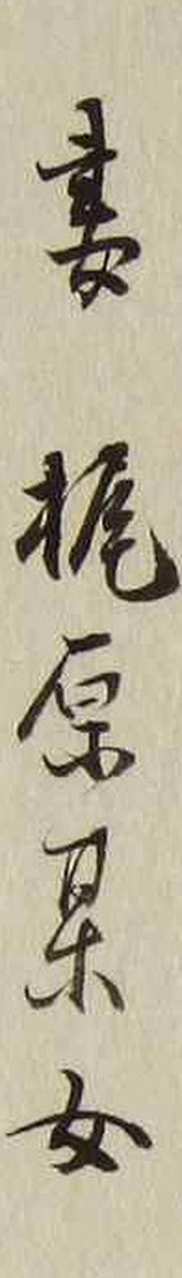妻梶原某女

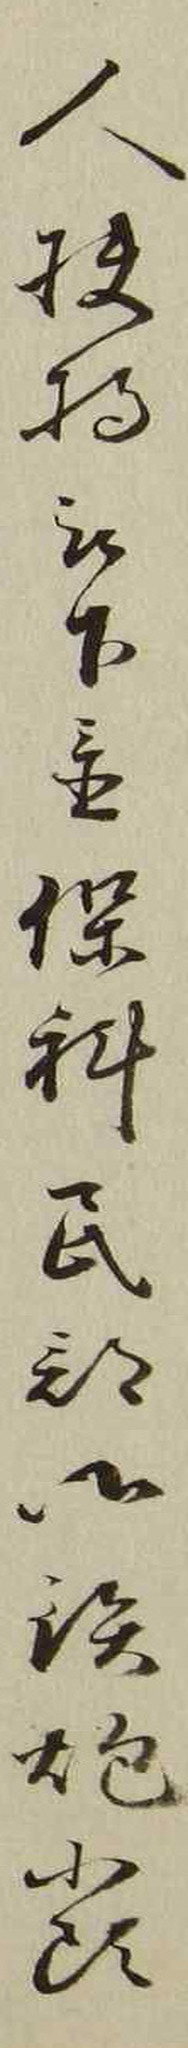人扶持被下置保科民部御鉄炮小頭
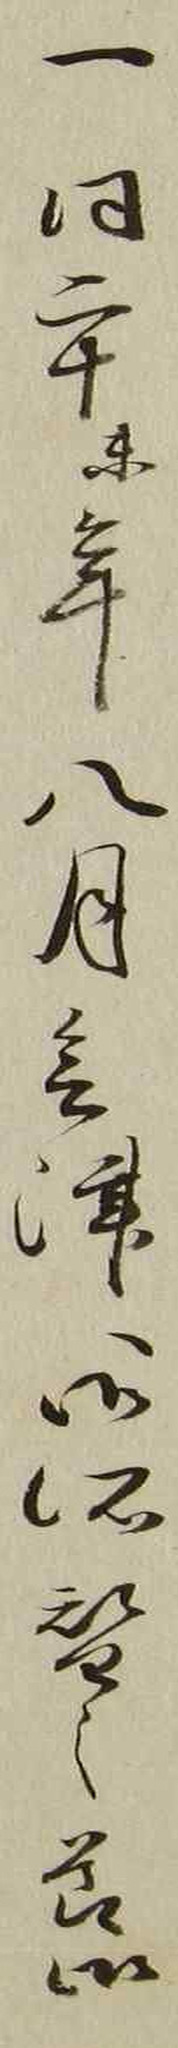一同二十未年八月会津へ御所替之節御
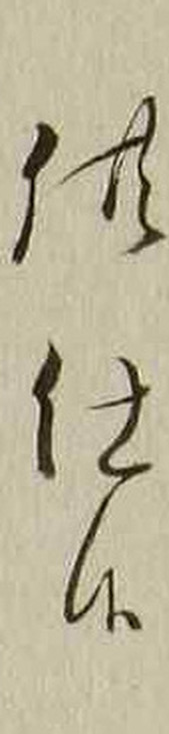供仕候
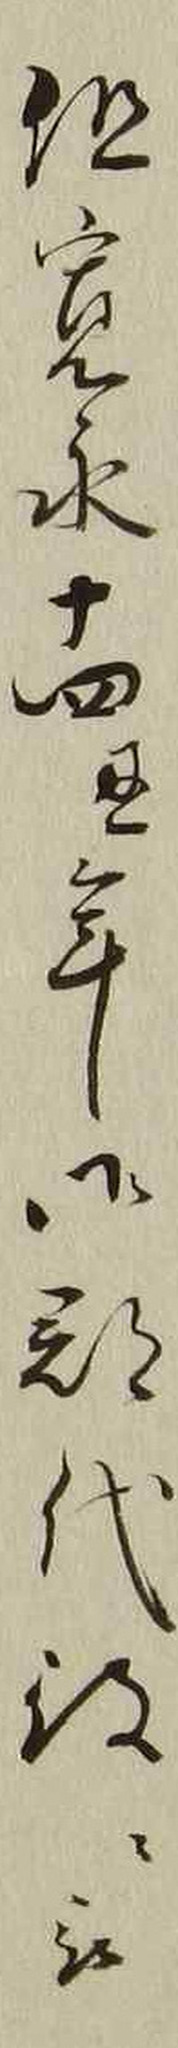但寛永十四丑年御郡代役へ被
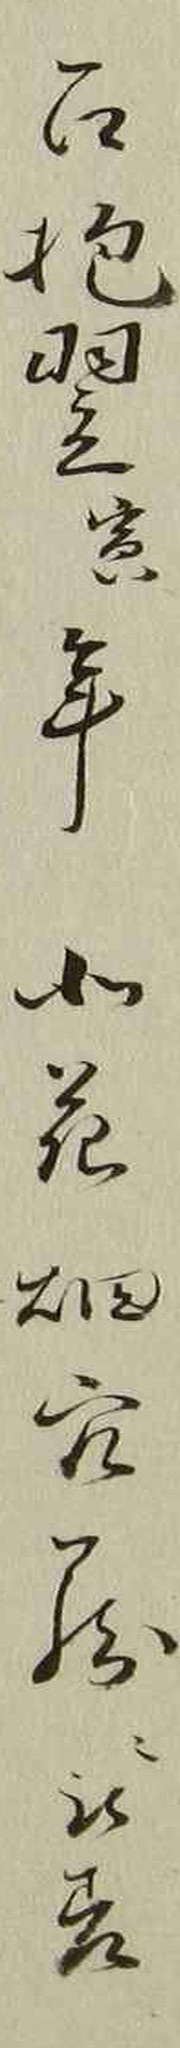召抱翌寅年北花畑穴蔵ニ被差
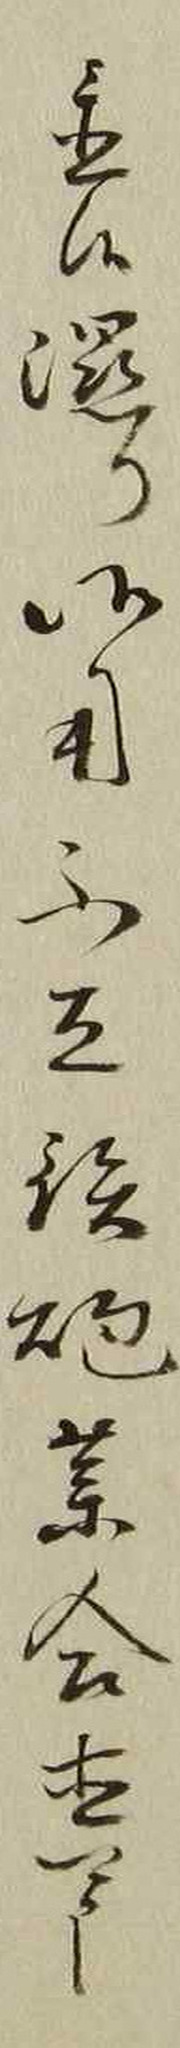置候湿り御用不立鉄炮薬合直いたし
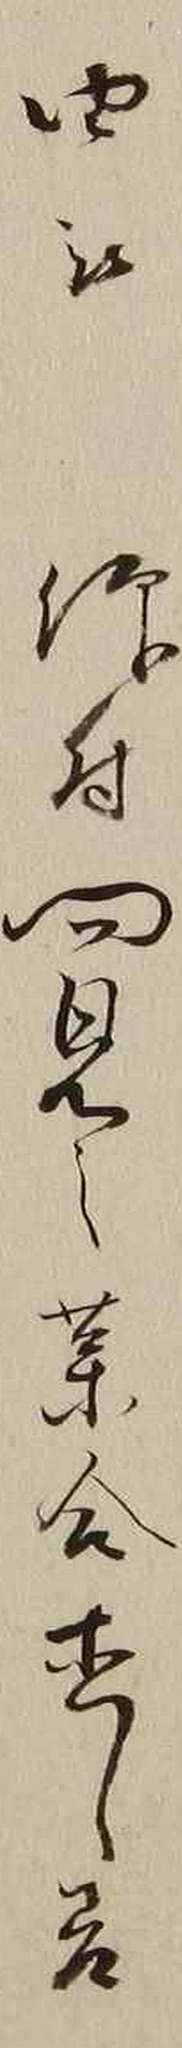由被仰付問見之薬合直し差
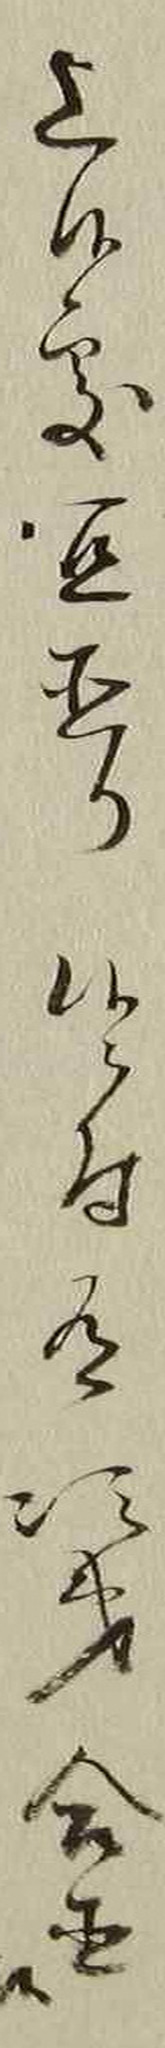上候処宜直り候ニ付有次第合直候
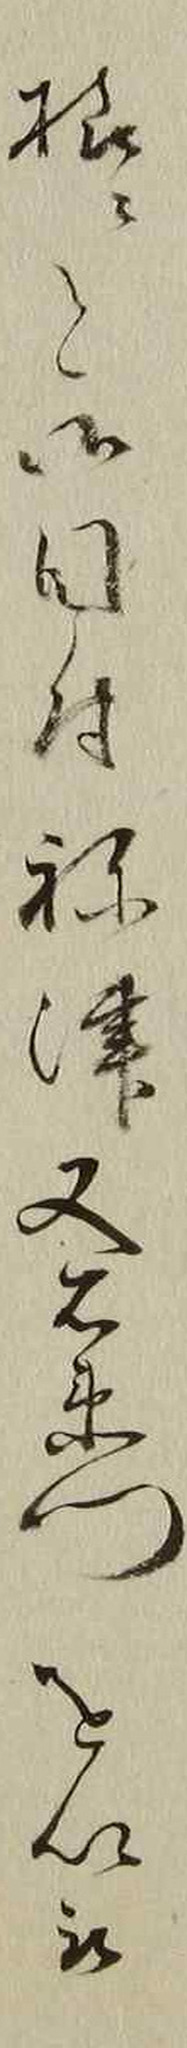様ニと御目付祢津又右衛門を以被
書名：諸士系譜　巻之52　に之部3
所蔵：会津若松市立会津図書館
